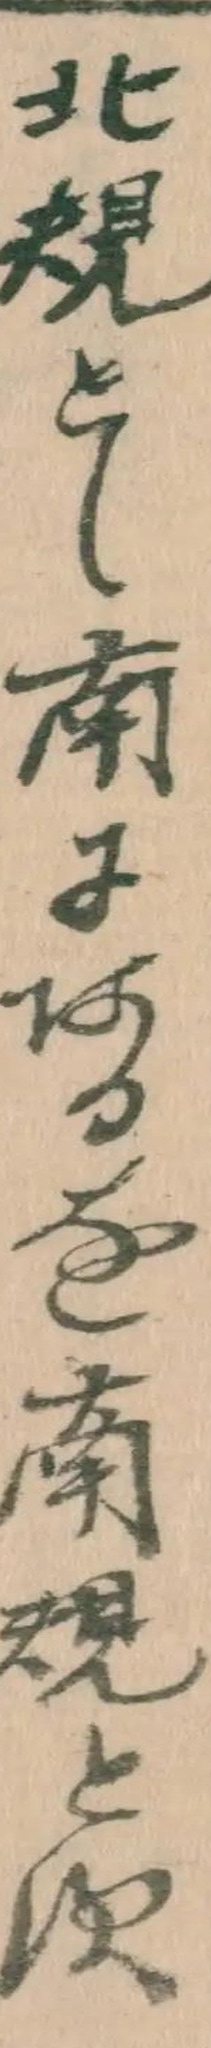北規とし南にあるを南規とす
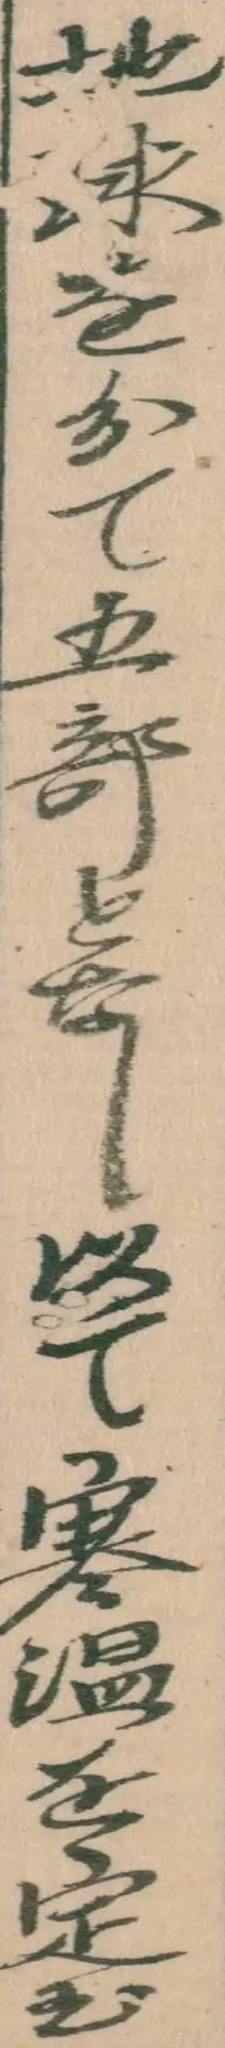地球を分て五部となし以て寒温を定む
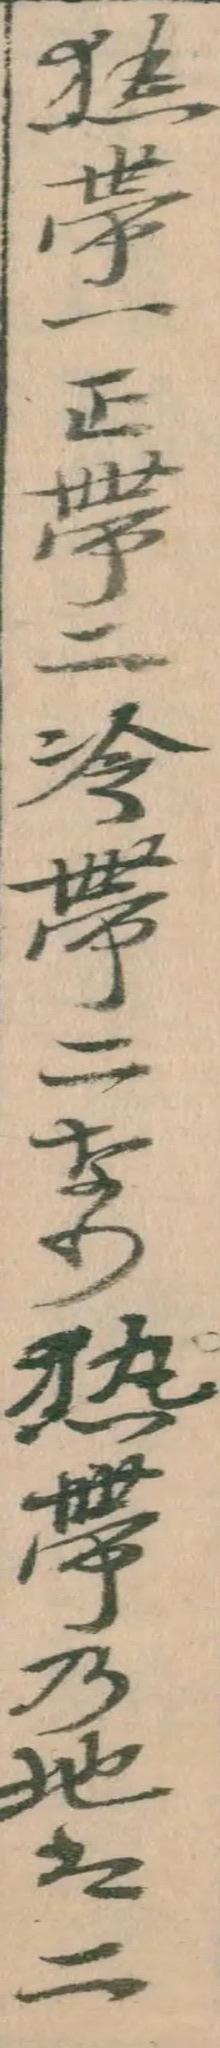熱帯一正帯二冷帯二なり熱帯の地は二
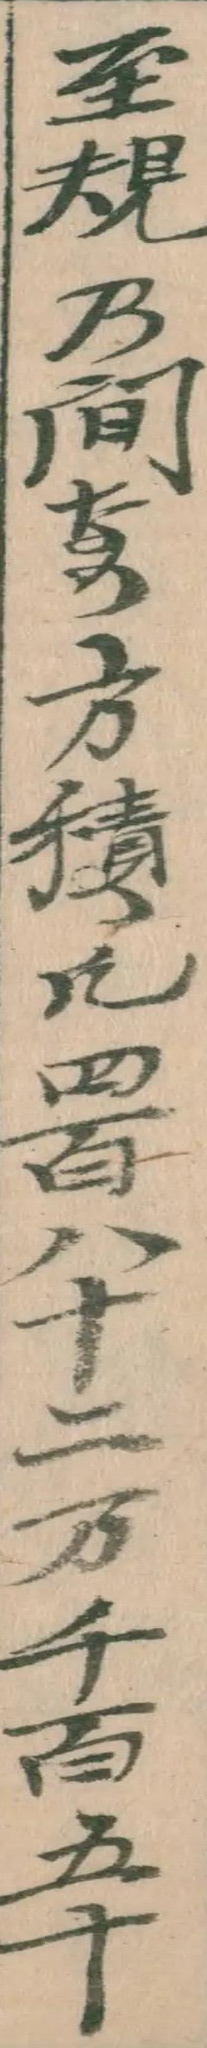至規の間なり方積凡四百八十二万千百五十
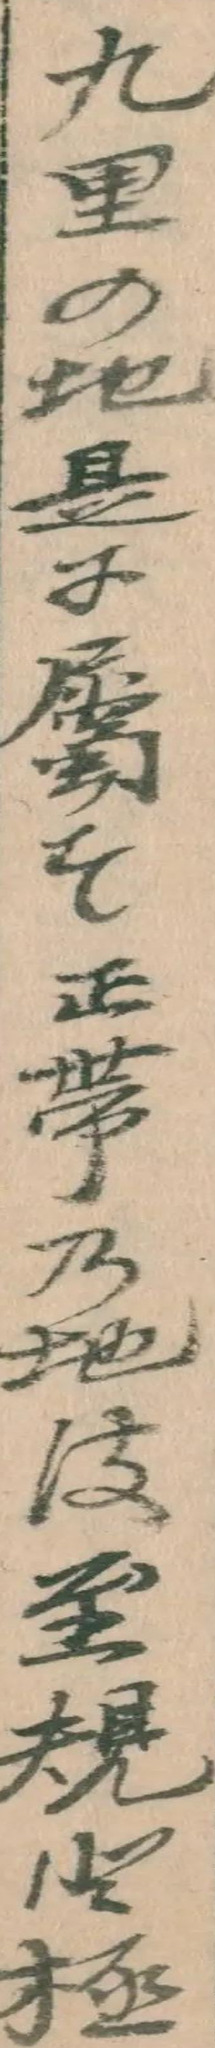九里の地是に属す正帯の地は至規と極
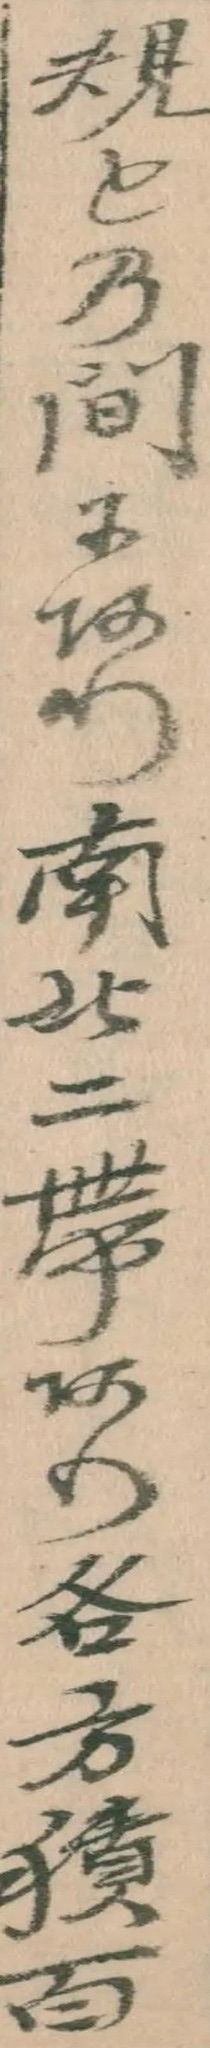規との間にあり南北二帯あり各方積百
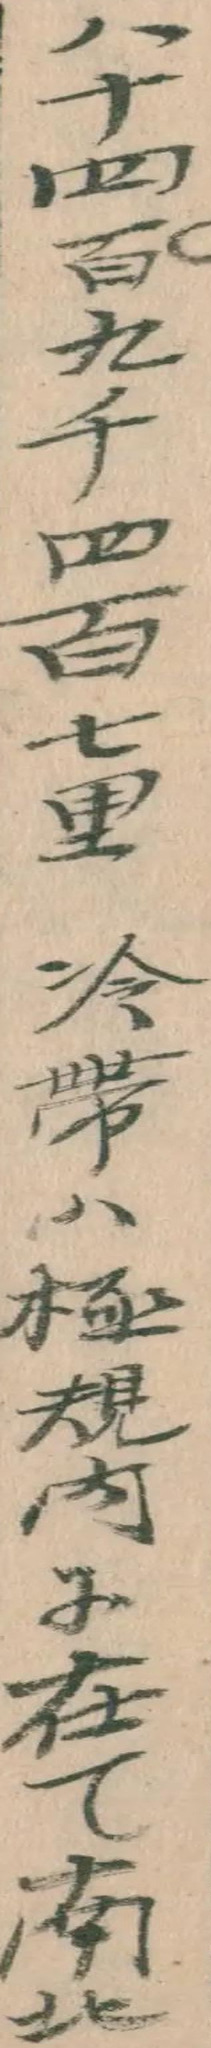八十四百九千四百七里冷帯は極規内に在て南北
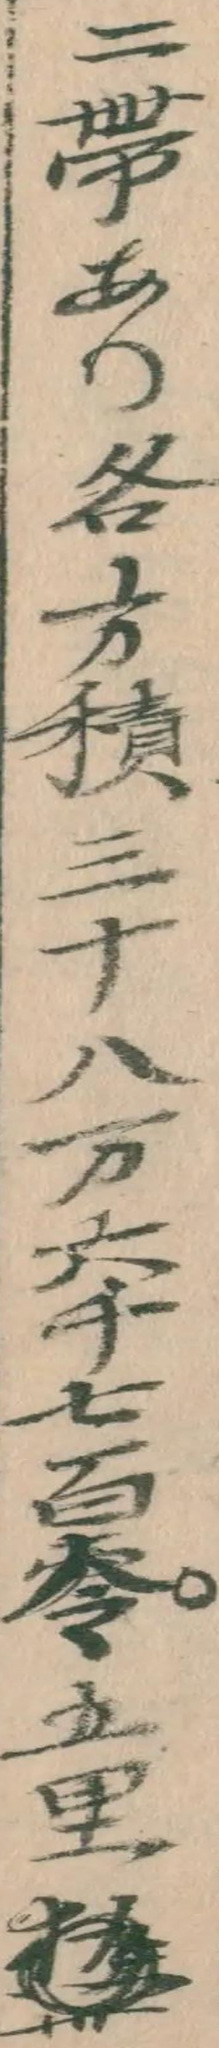二帯あり各方積三十八万六千七百零五里
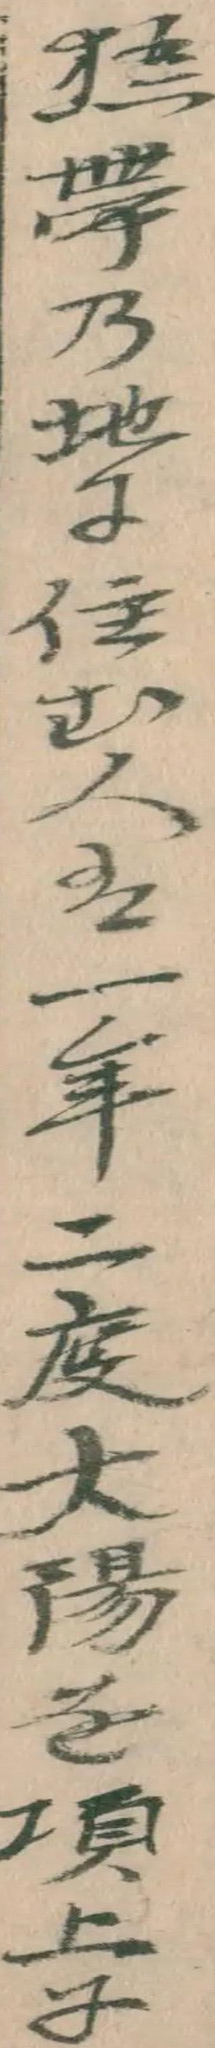熱帯の地に住む人は一年二度大陽を頂上に

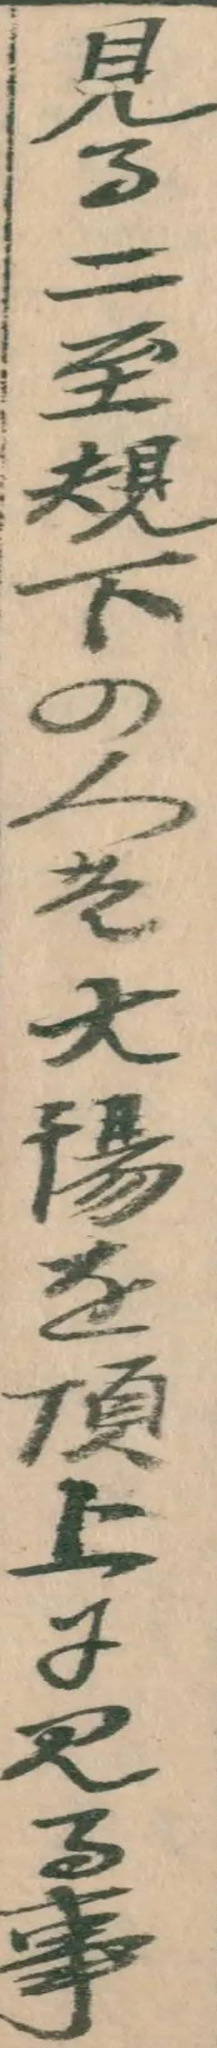見るに至規下の人は大陽を頂上に見る事
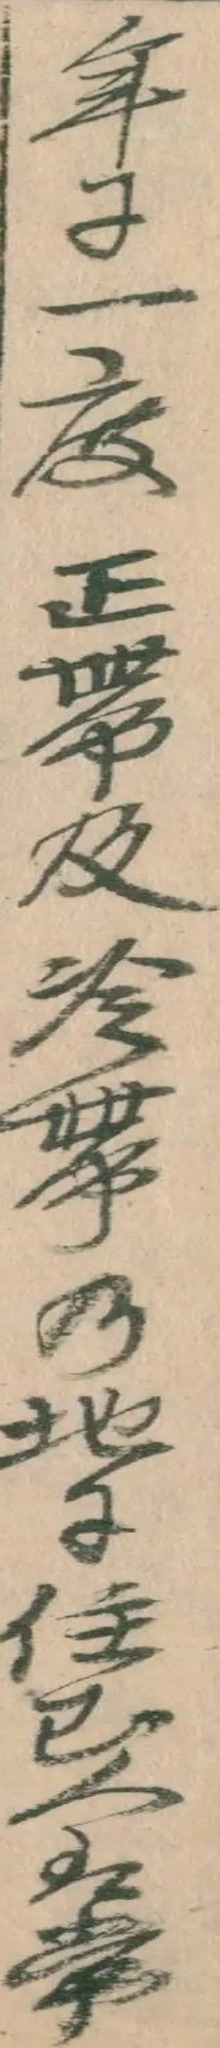年に一度正帯及冷帯の地に住む人は常
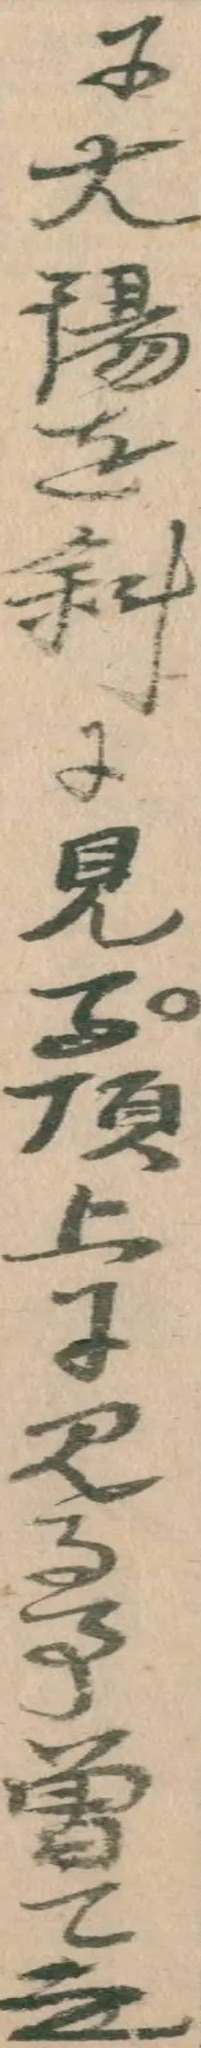に大陽を斜に見て頂上に見る事曽て之
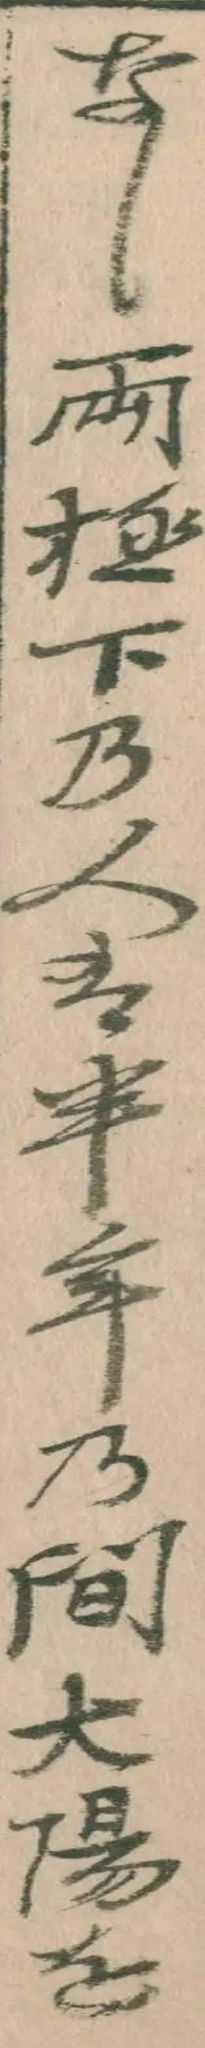なし両極下の人は半年の間大陽を
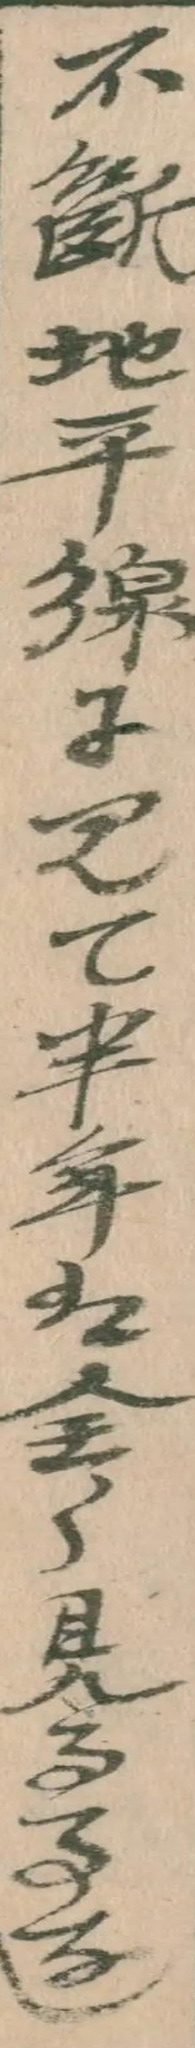不断地平線に見て半年は全く見る事なし
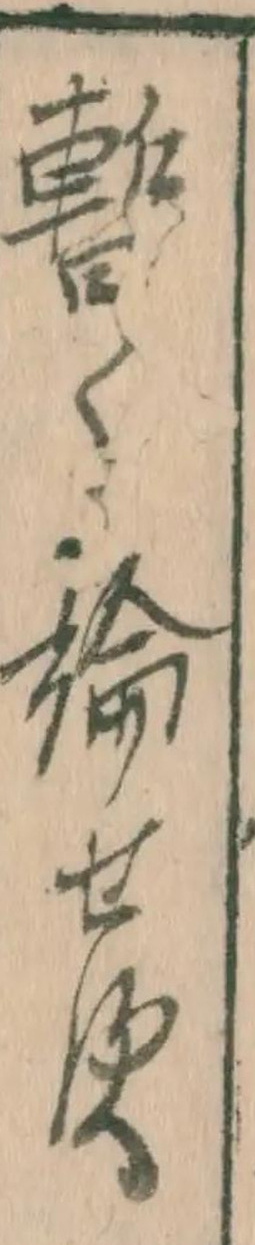暫く論せす
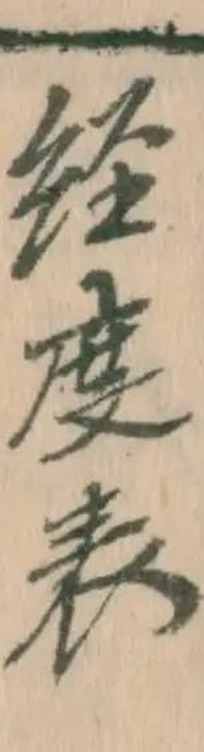経度表
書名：新釈輿地図説
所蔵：国立国会図書館 National Diet Library, JAPAN
